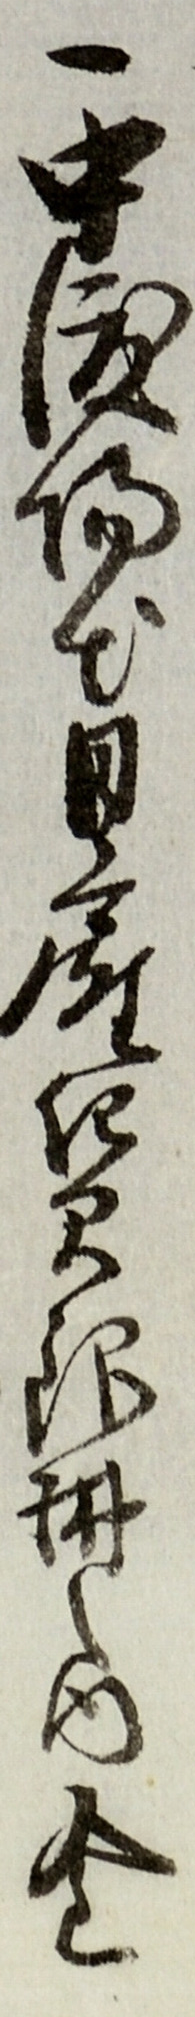一中渡場出日雇賃銀払之内金
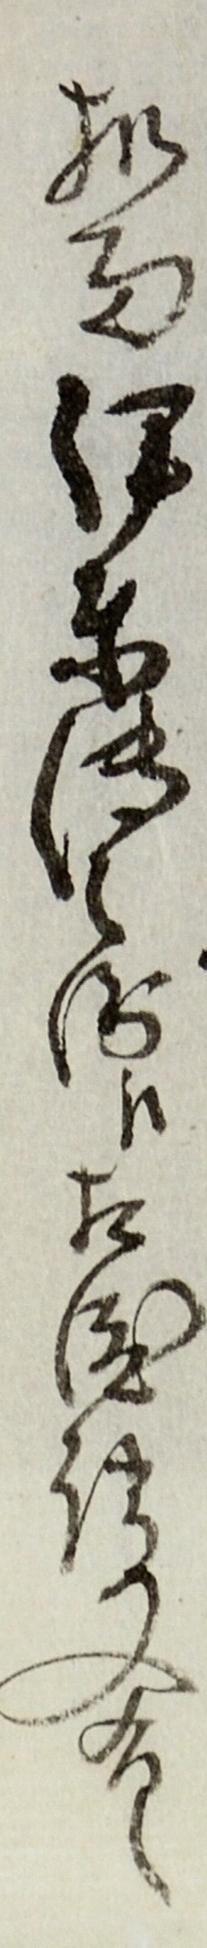拾両伊東伝兵衛江相渡証文有之
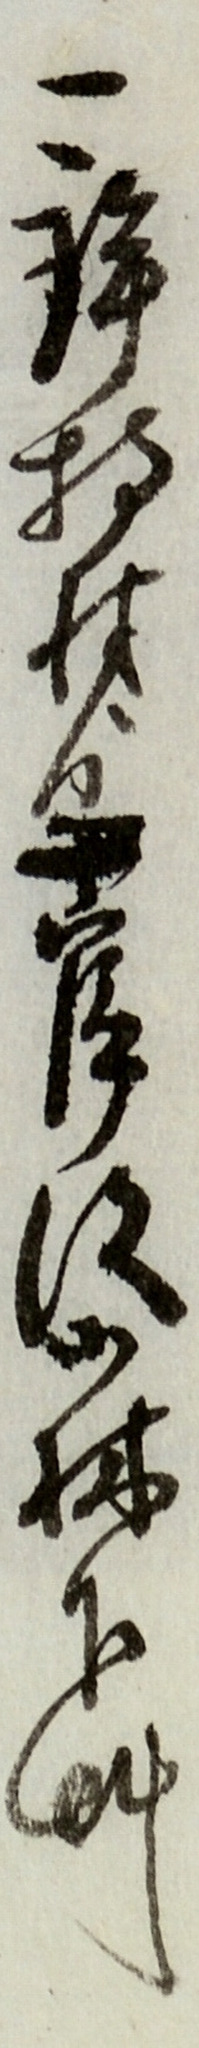一鉾持村ゟ菅沢御林下草
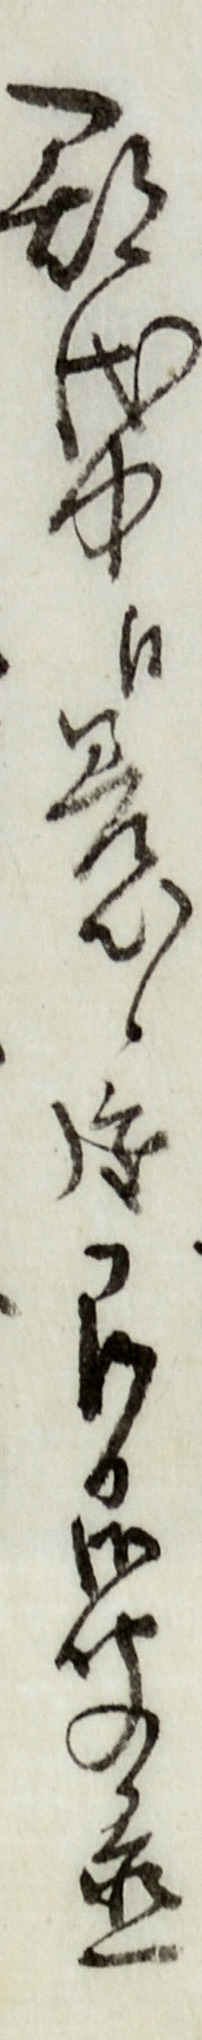郡代中江差出候処即日御聞置
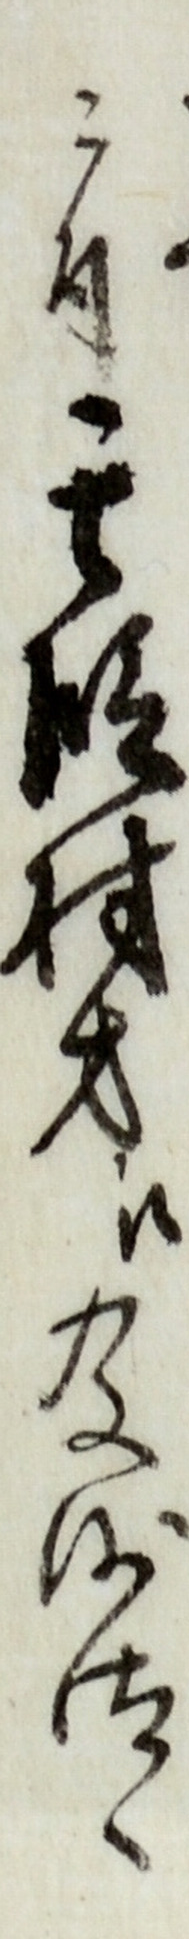ニ付其段村方江及沙汰候

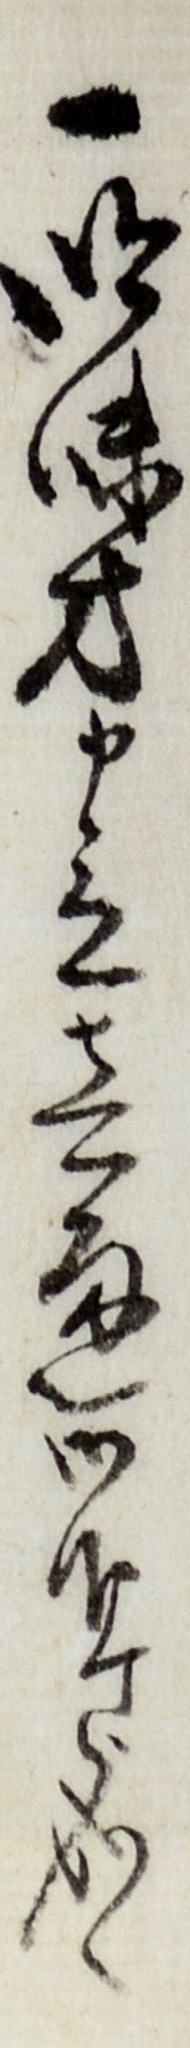一吟味方申立壱通御下ケ被成候
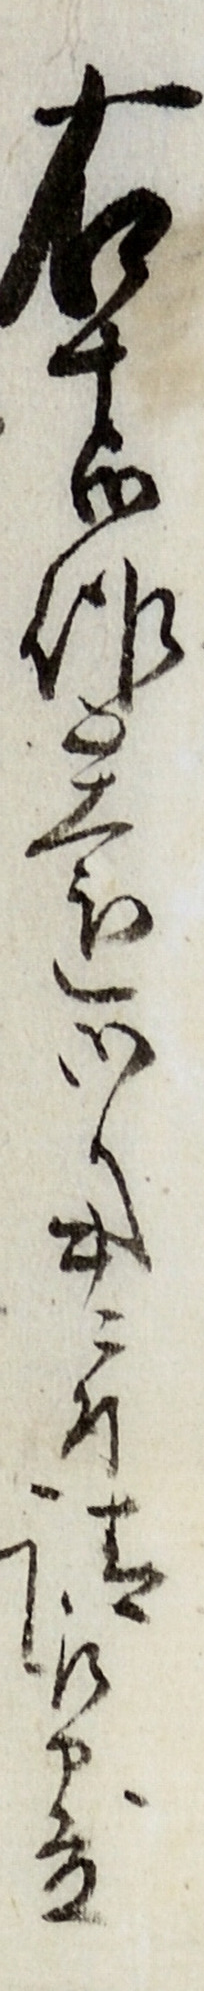右者御作薗御用ニ付請取申度
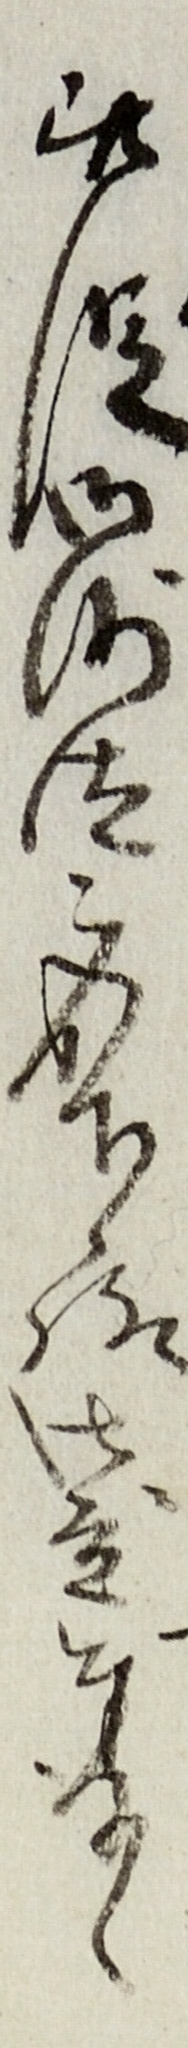此段御沙汰被成下候様此度奉存候
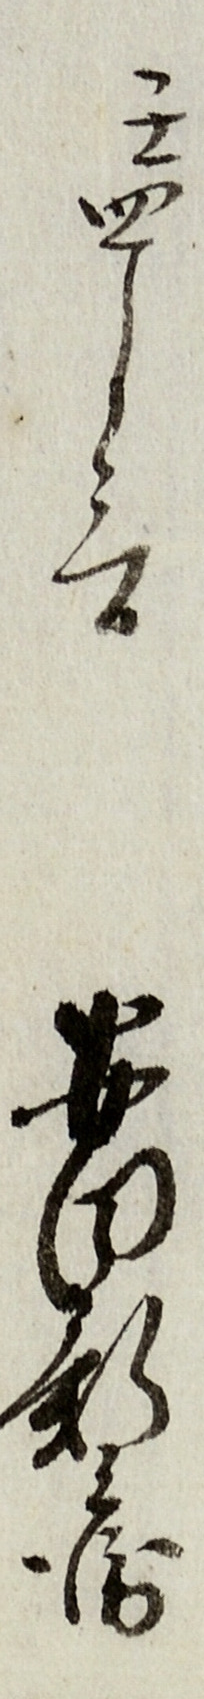閏四月三日安田新兵衛
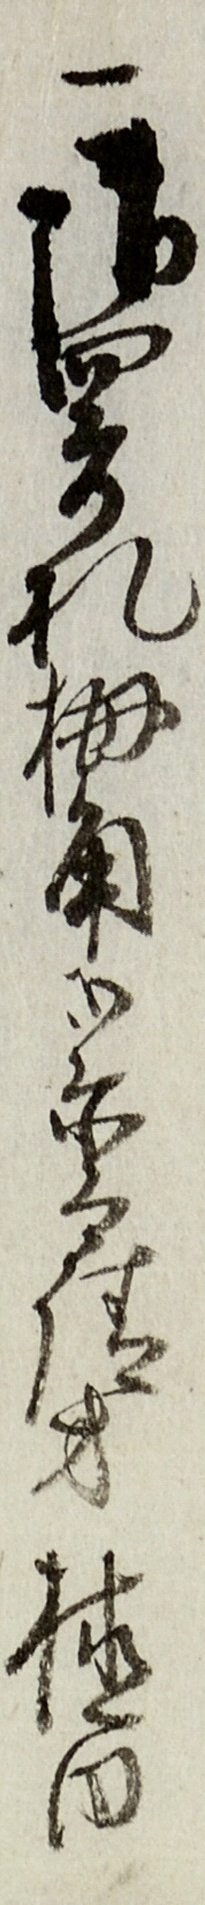一御関札栂角御普請方植田
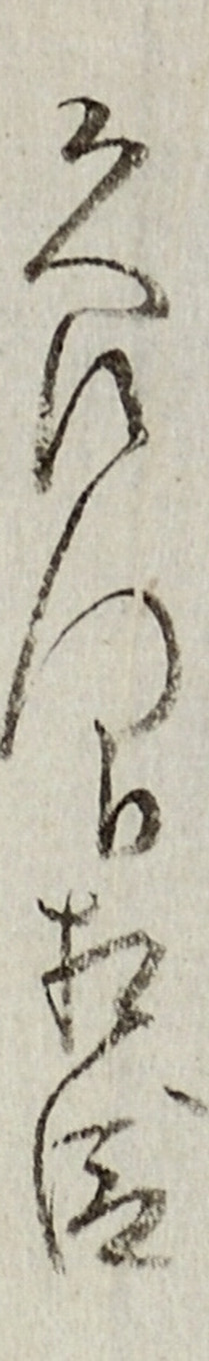久左衛門江相渡
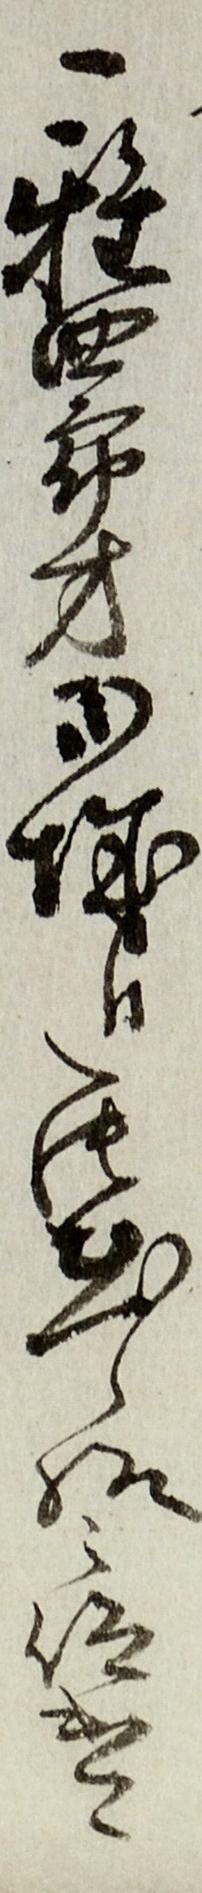一雅四郎方御城江罷出候処被仰遣候
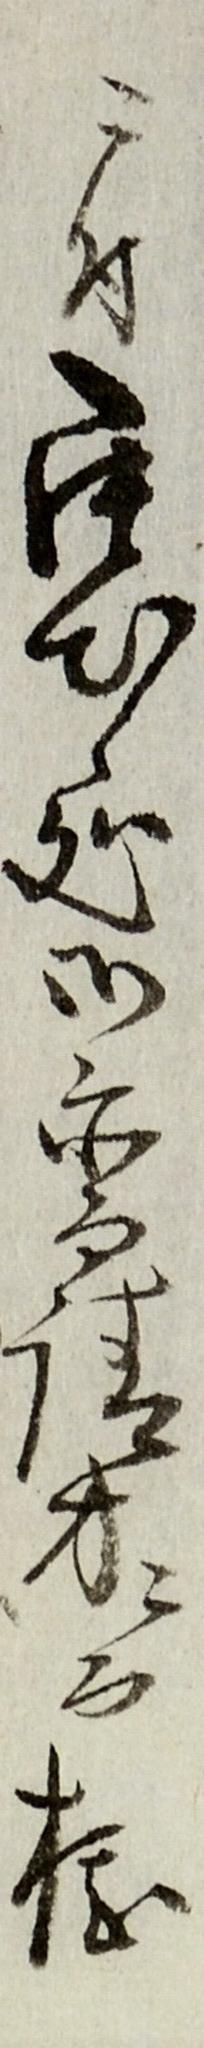ニ付罷出候処御普請方ニ而椹
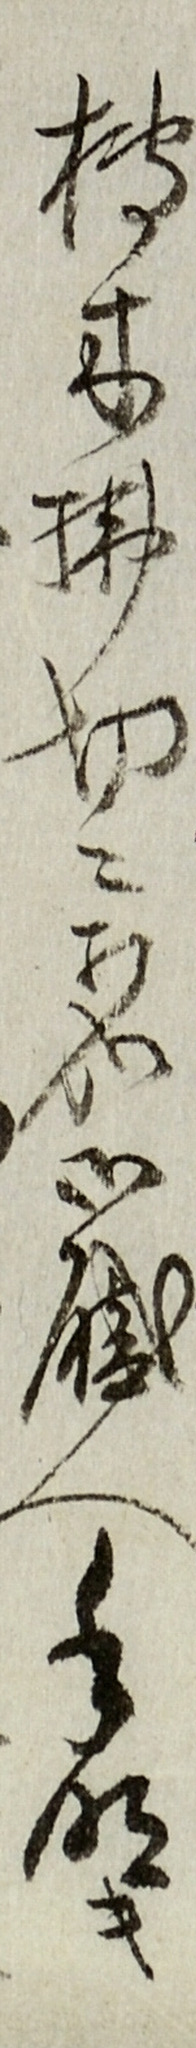槫木払切ニ相成御職人手明キ
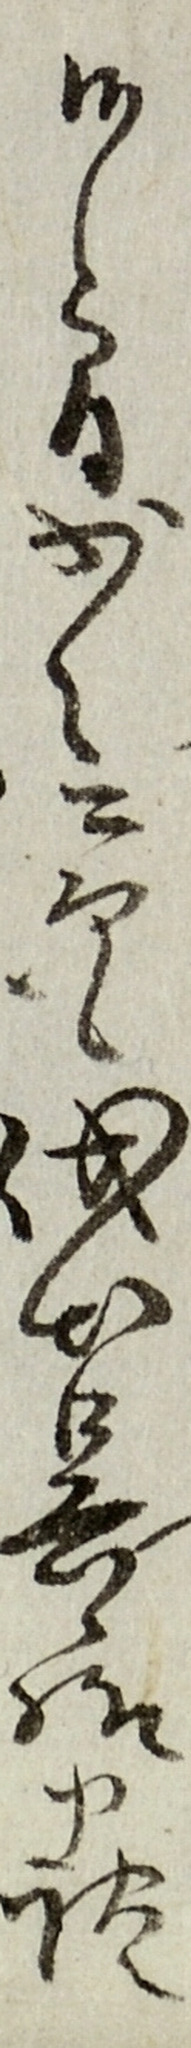候間少々ニ而も伐出呉候様申談
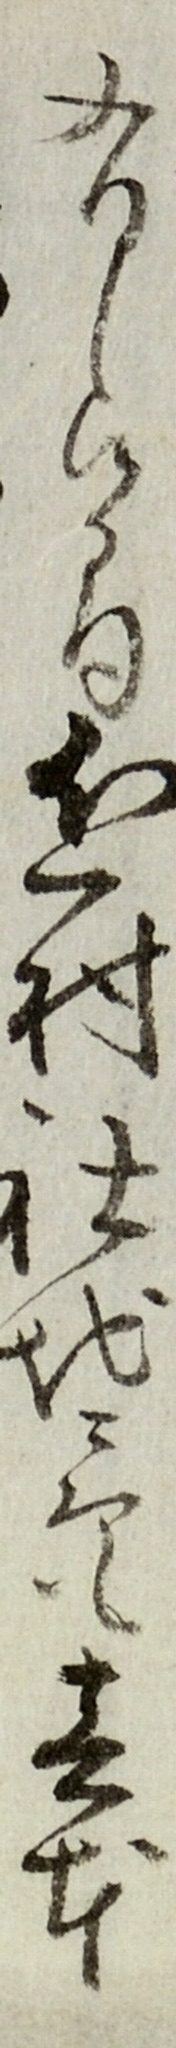有之候間近村社地ニ而も壱本
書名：御山方御薪方諸事御用留
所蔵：伊那市立高遠町図書館・合同会社AMANE
